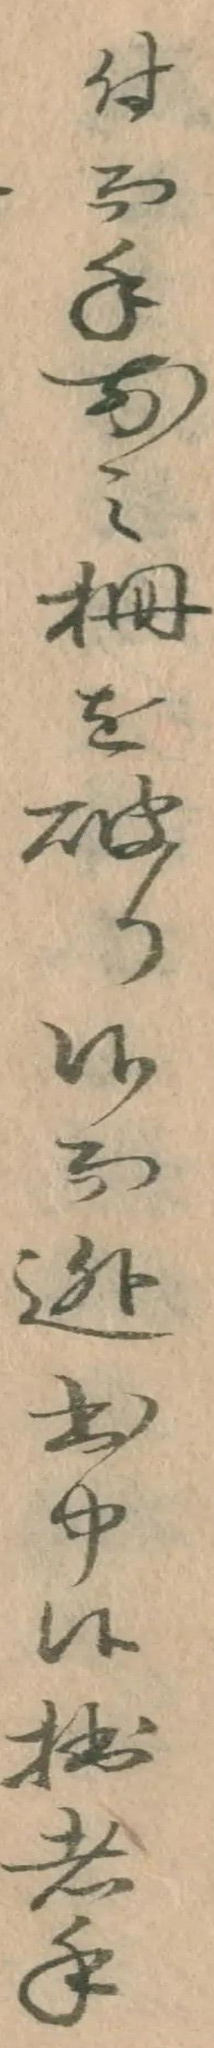付而手前之柵を破り候而逃出申候拙者手
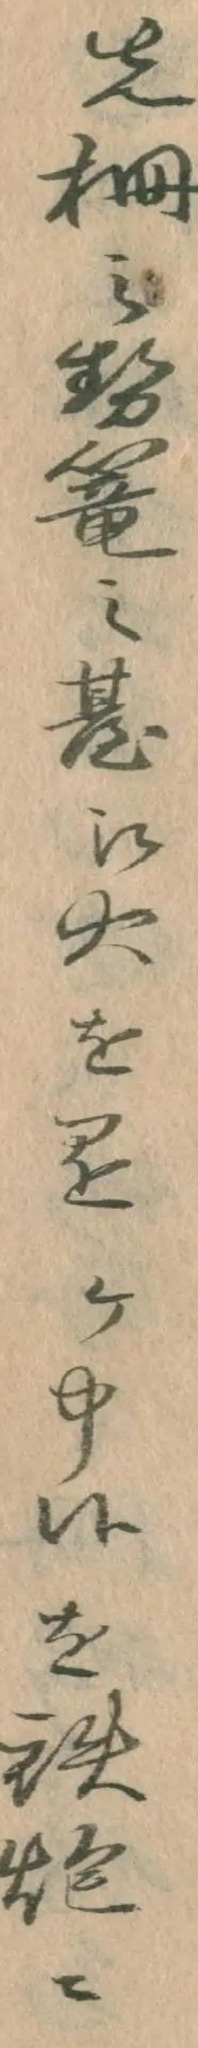先柵之勢篭之臺江火を懸け申候を鉄炮に
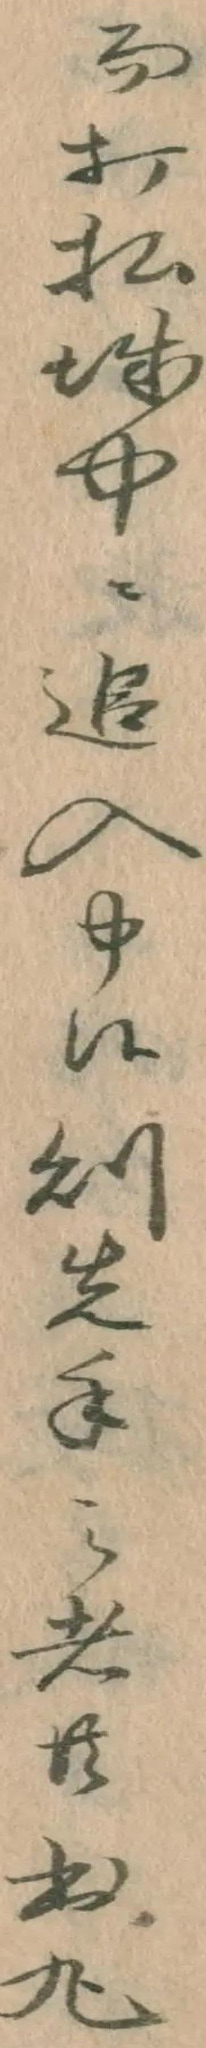而打払城中に追入申候則先手之者共出丸
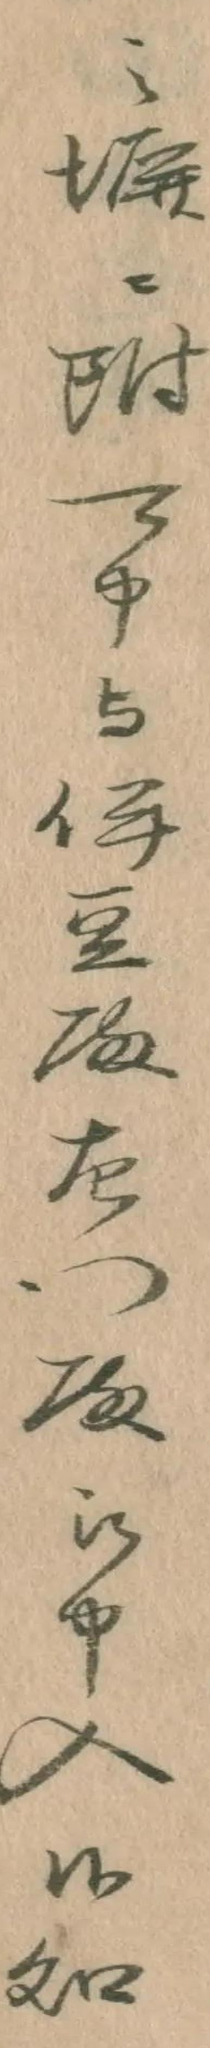之塀に附可申与伊豆殿左門殿被申入候処
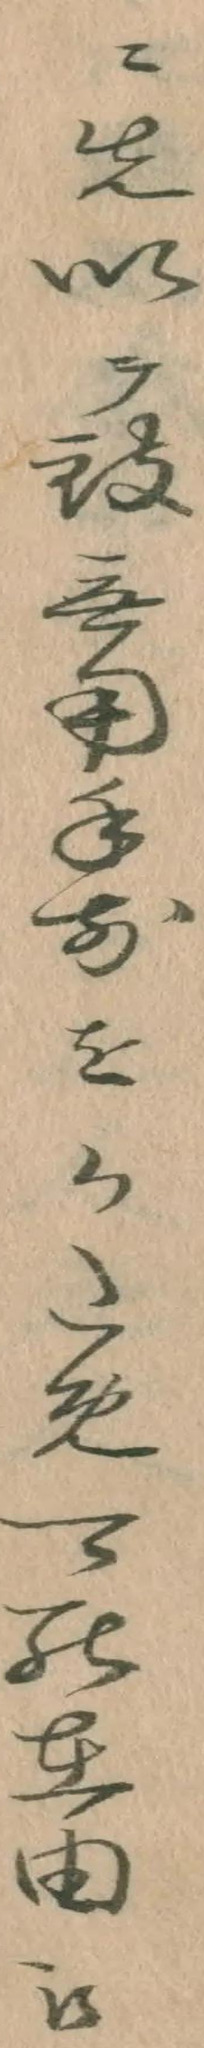に先以て致無用手前をかた免可罷在由被
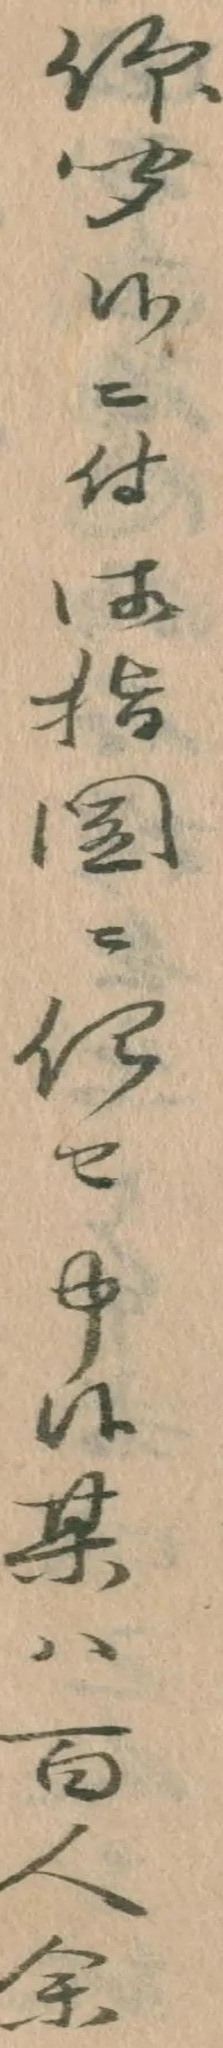仰聞候に付御指図に任せ申候某は百人余
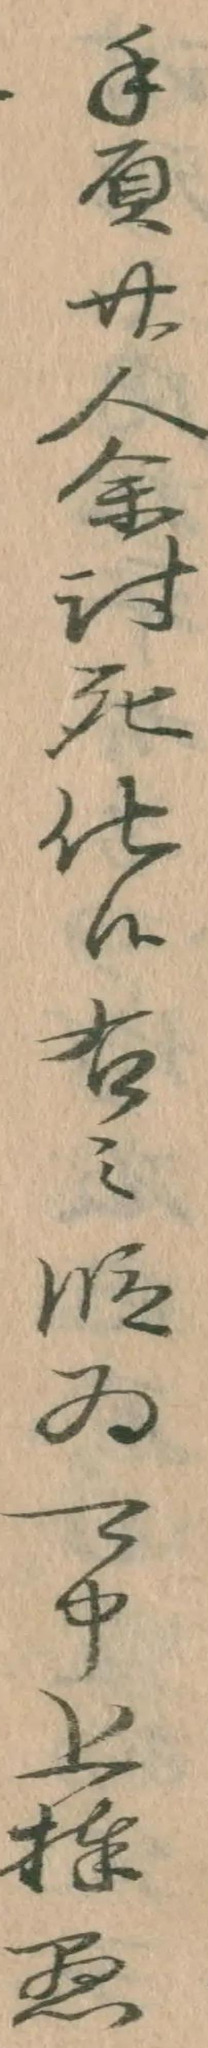手負廿人余討死仕候右之段ゐ可申上捧悪
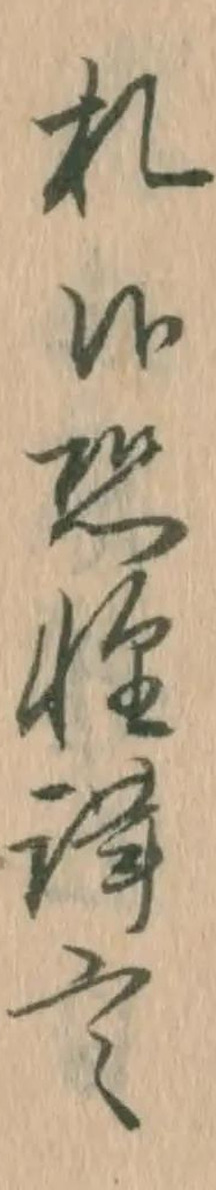札候恐惶謹言
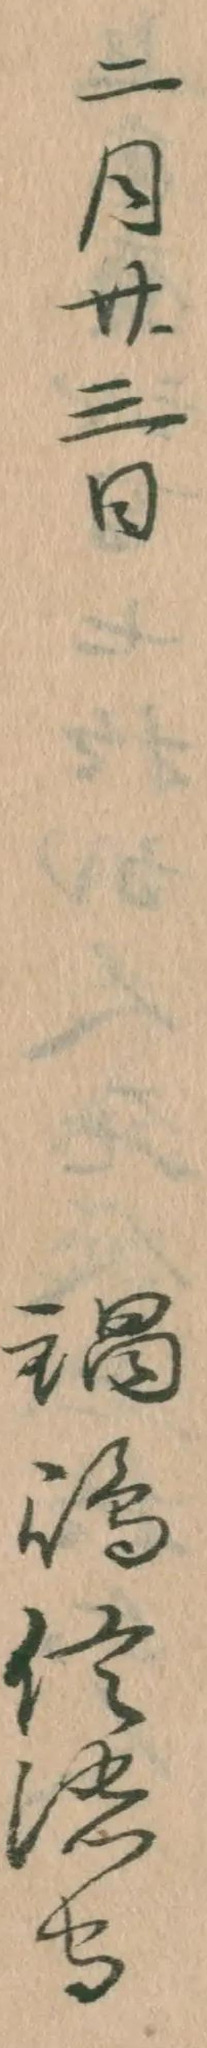二月廿三日鍋島信濃守
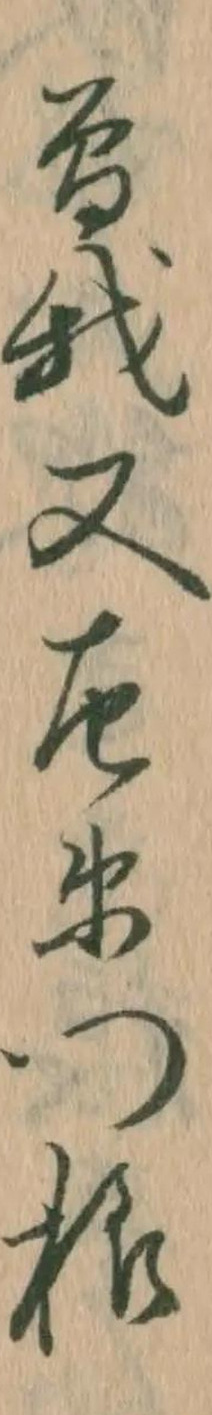曽我又左衛門様
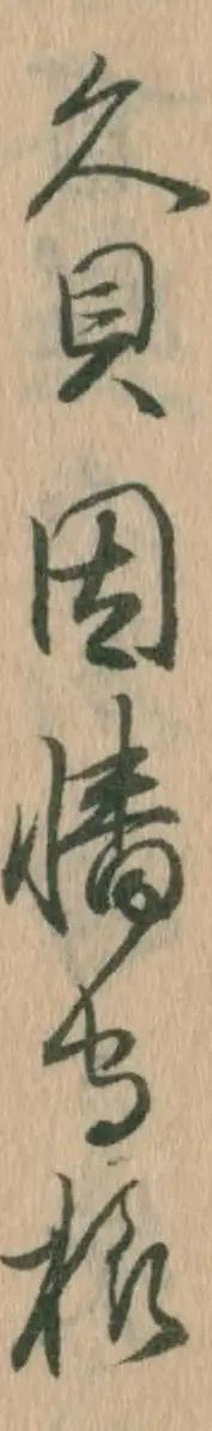久貝因幡守様
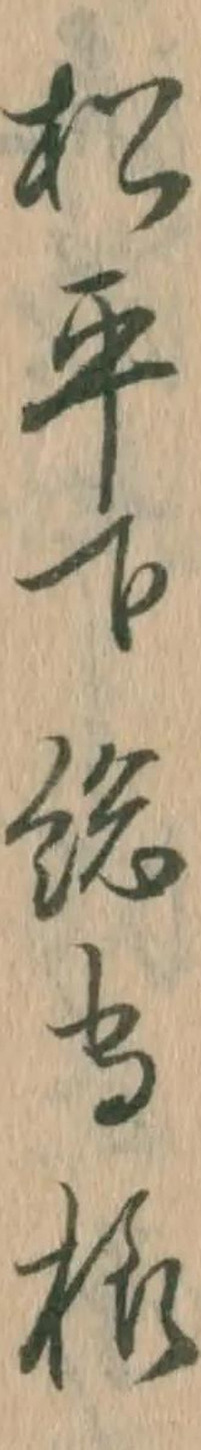松平下総守様
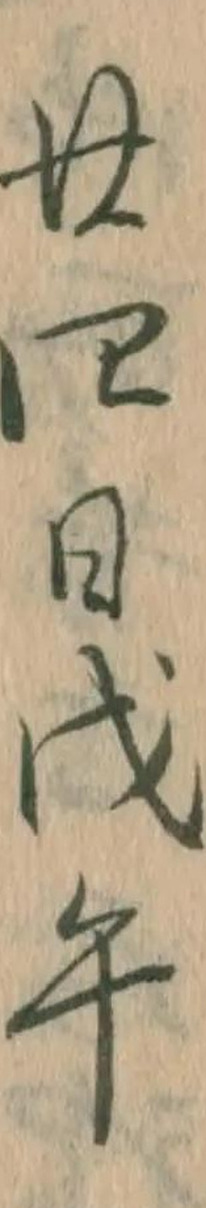廿四日戌午
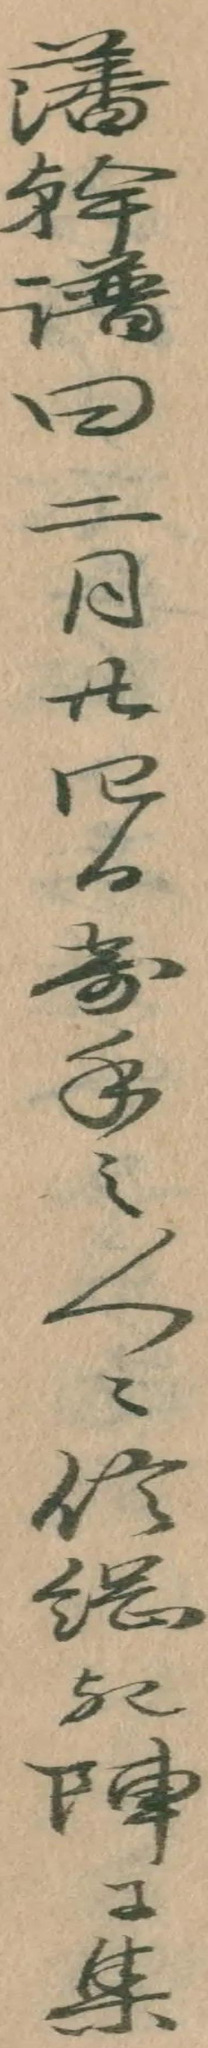藩幹譜曰二月廿四日寄手之人々信綱歟陣尓集
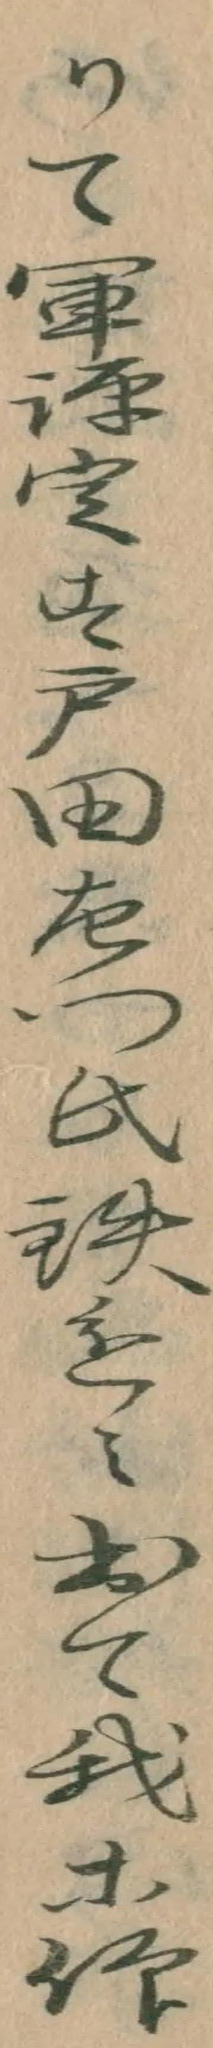りて軍評定春戸田左門氏鉄進之出て我等仰
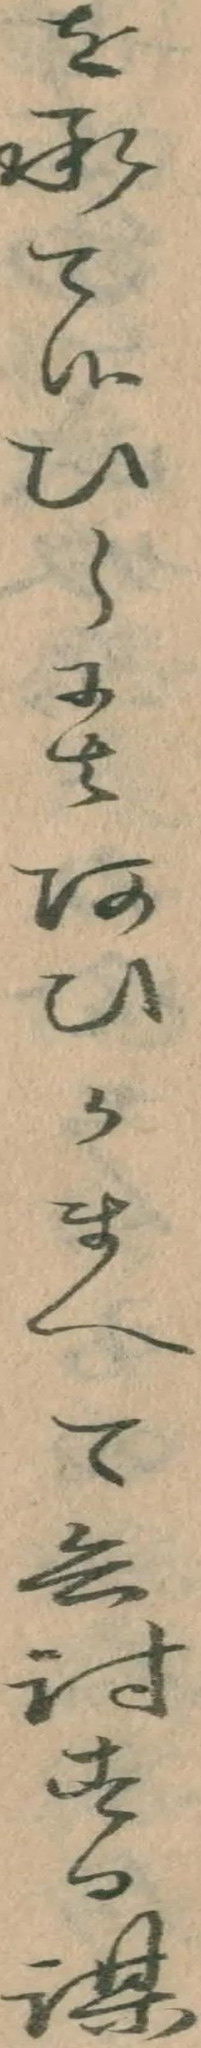を承て候ひし尓者阿ひかまへて兵討春る謀
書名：切支丹御退治記 49巻. [7]
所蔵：国立国会図書館 National Diet Library, JAPAN
